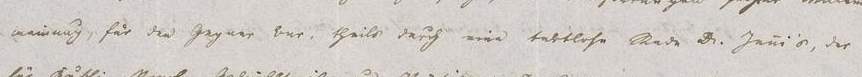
meinung, für die Gegner war, theils durch eine taktlose Rede Dr. Jenni's, der
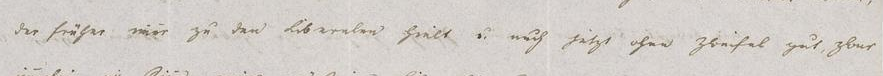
der früher immer zu den Liberalen hielt u. auch jetzt ohne Zweifel gut, zwar
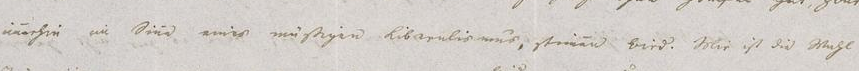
immerhin im Sinne eines mäßigen Liberalismus, stimmen wird. Mir ist die Wahl
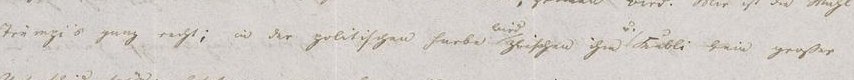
Trümpi's ganz recht; in der politischen Farbe wird zwischen ihm u.Kubli kein großer
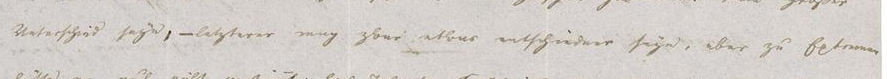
Unterschied seyn, – letzterer mag zwar etwas entschiedner seyn, aber zu Extremen
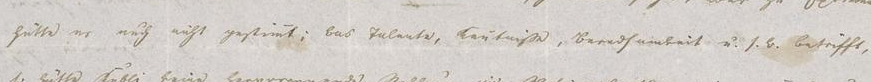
hätte er auch nicht gestimmt; was Talente, Kenntnisse, Beredsamkeit u. s. w. betrifft,
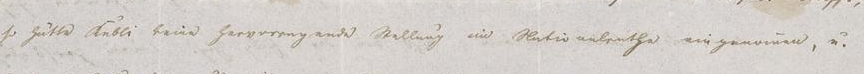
so hätte Kubli keine hervorragende Stellung im Nationalrathe eingenommen, u.
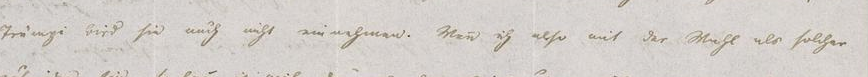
Trümpi wird sie auch nicht einnehmen. Wenn ich also mit der Wahl als solcher
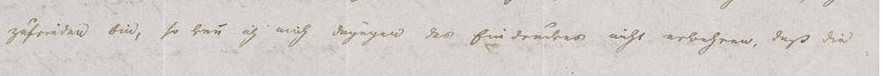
zufrieden bin, so kann ich mich dagegen des Eindruckes nicht erwehren, daß die
